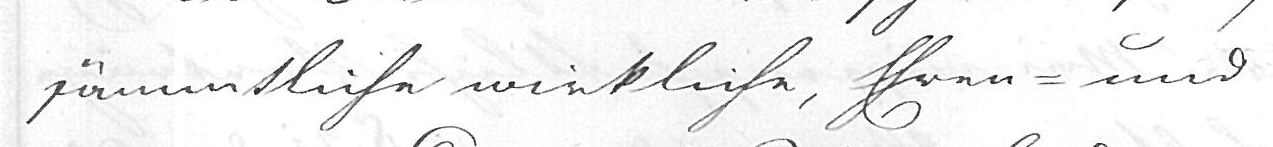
sämmtliche wirkliche, Ehren- und
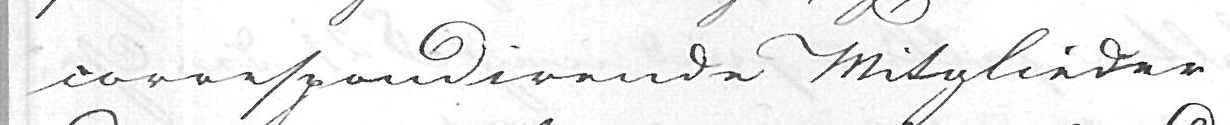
correspondirende Mitglieder
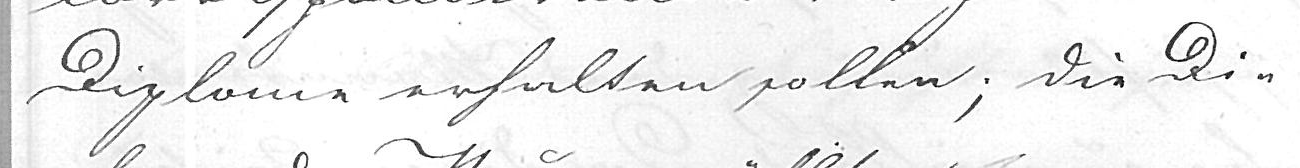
Diplome erhalten sollen; die Di-
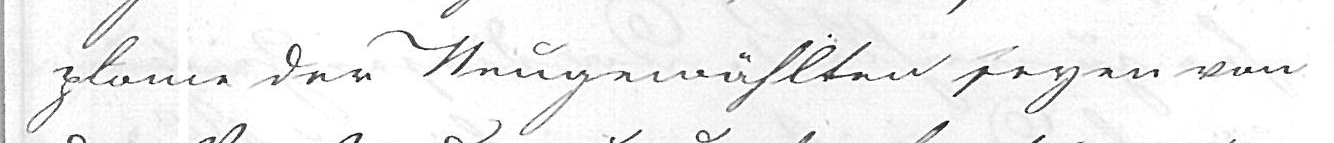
plome der Neungewählten seyen von
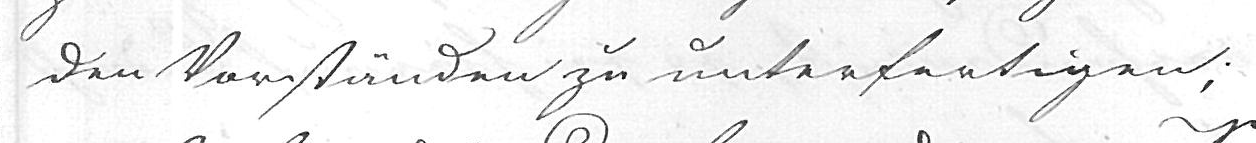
den Vorständen zu unterfertigen;
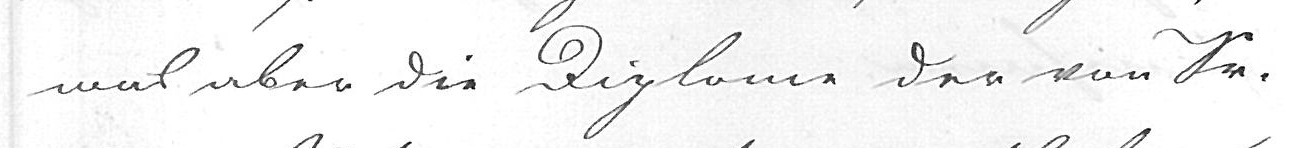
was aber die Diplome der von Sr.
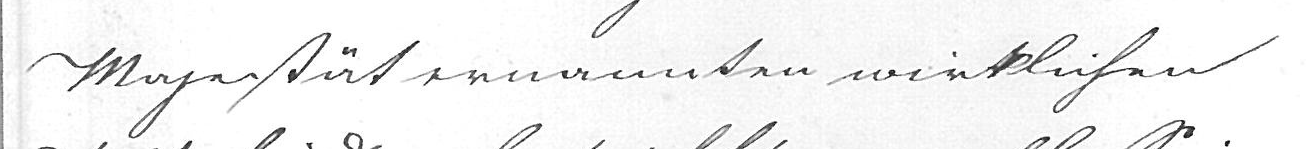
Majestät ernannten wirklichen
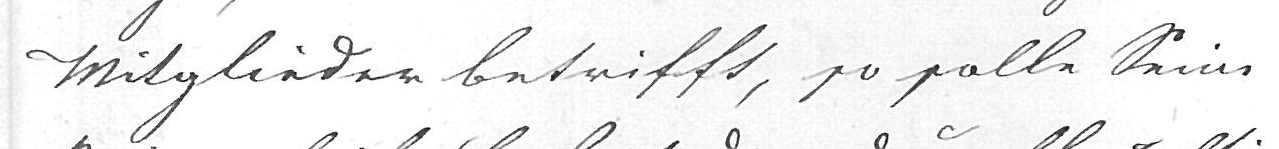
Mitglieder betrifft, so solle Seine
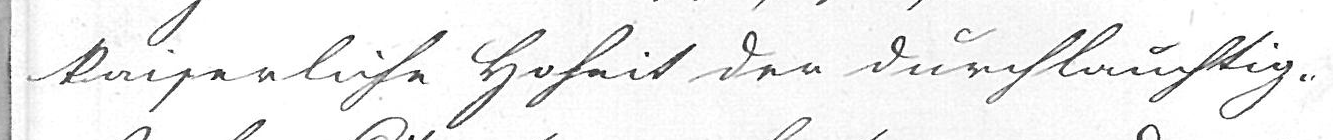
kaiserliche Hoheit der durchlauchtig-
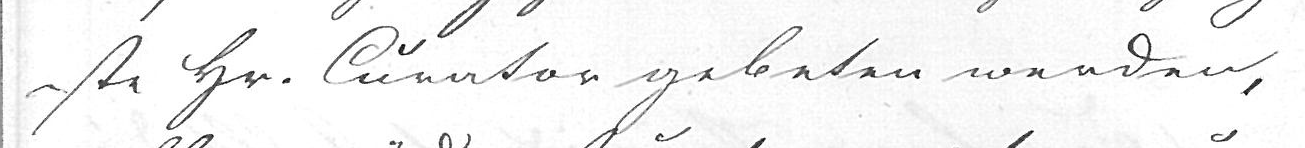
ste Hr. Curator gebeten werden,
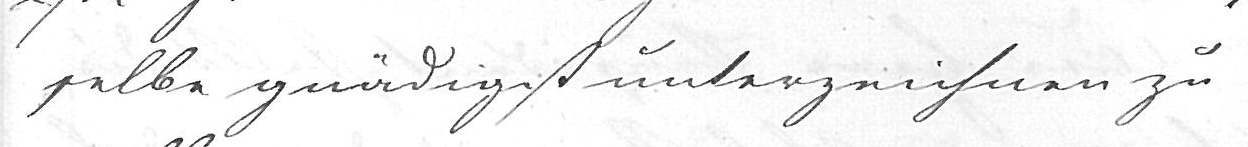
selbe gnädigst unterzeichnen zu
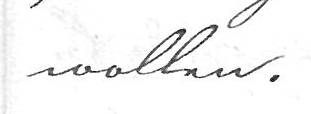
wollen.
